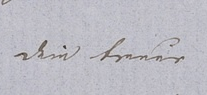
Dein treuer
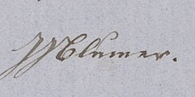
J J Blumer.
